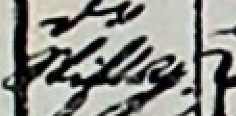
Stiftsg.
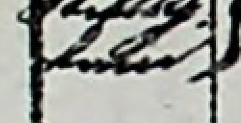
Rain
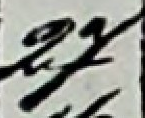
27
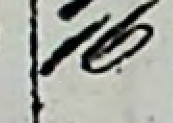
16
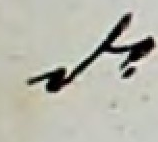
do
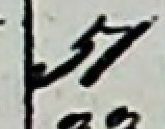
51
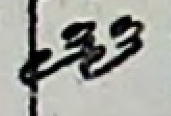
33
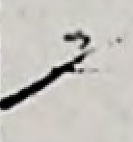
7
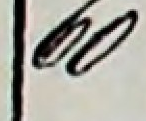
60
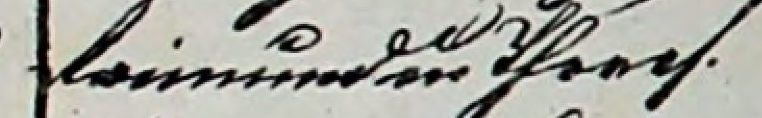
Raimund u. Theres.
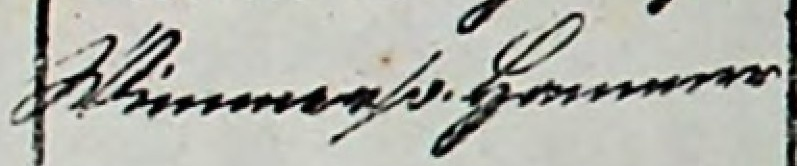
Wimmer so. Hammer
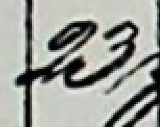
23
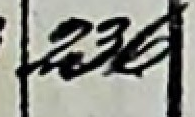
236
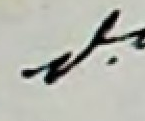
do
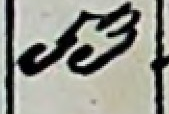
53
